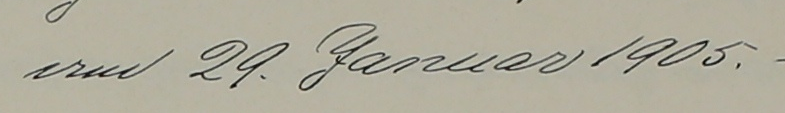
am 29. Januar 1905.
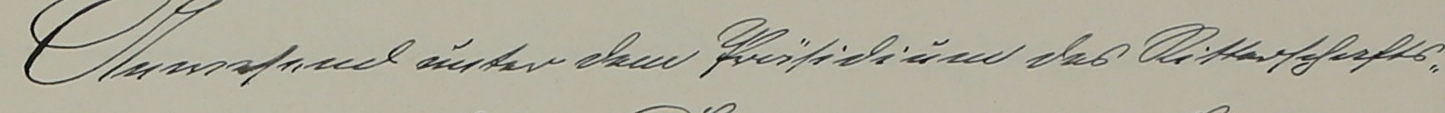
Anwesend unter dem Präsidium des Ritterschafts-
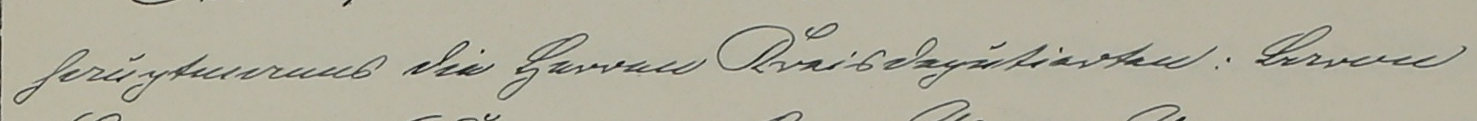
hauptmanns die Herren Kreisdeputierten: Baron
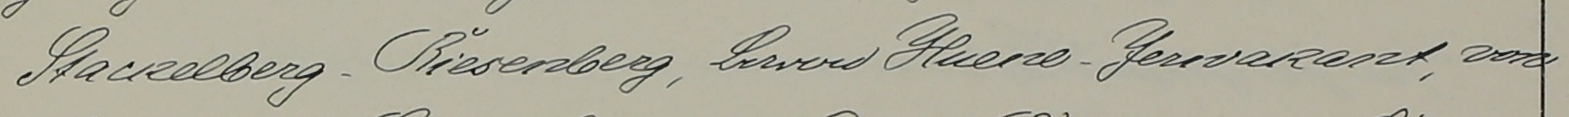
Stackelberg-Riesenberg, Baron Huene-Jerwakant, von
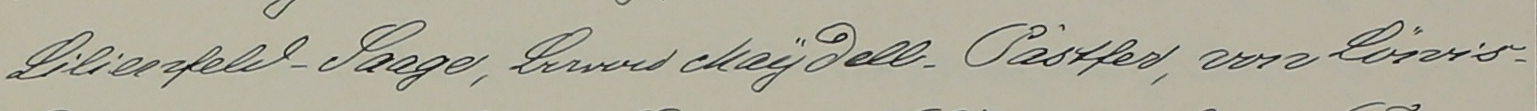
Lilienfeld-Saage, Baron Maydell-Pastfer, von Löwis-
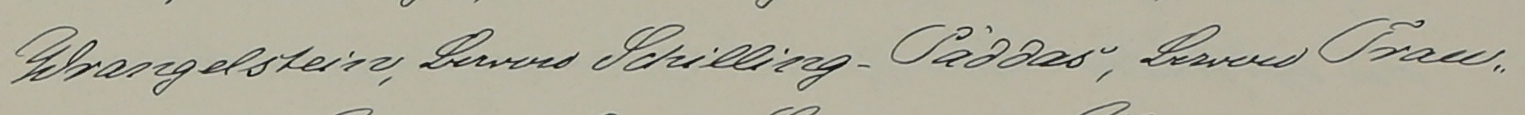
Wrangelstein, Baron Schilling-Paddas, Baron Trau-
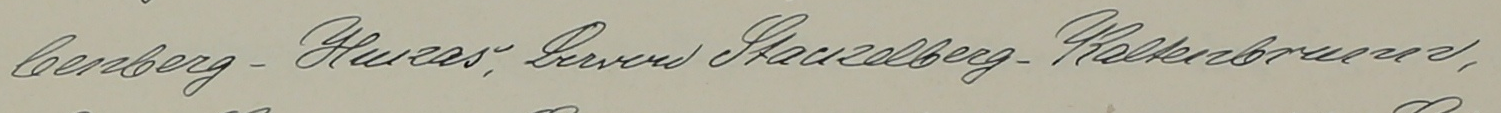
benberg-Hukas, Baron Stackelberg-Kaltenbrunn,
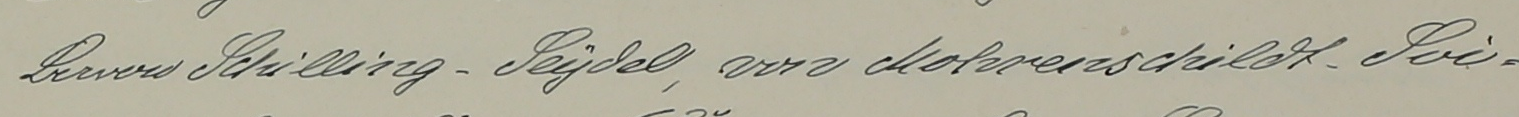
Baron Schilling-Seydel, von Mohrenschildt-Soi-
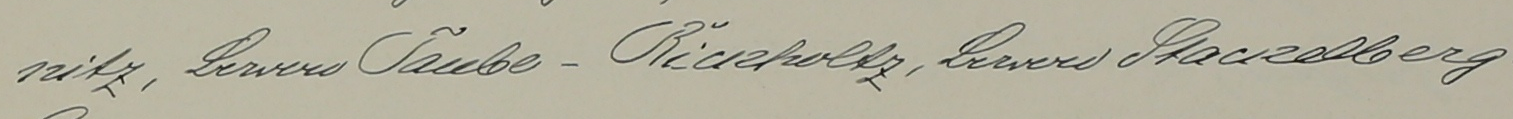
nitz, Baron Taube-Rickholtz, Baron Stackelberg-
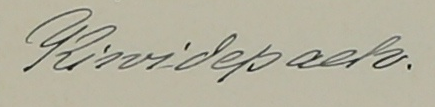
Kiwidepaeh.
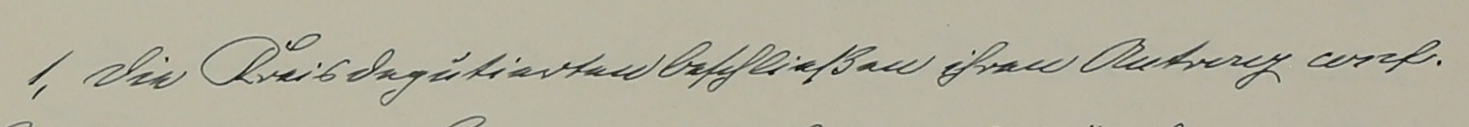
1. Die Kreisdeputierten beschließen, ihren Antrag conf.
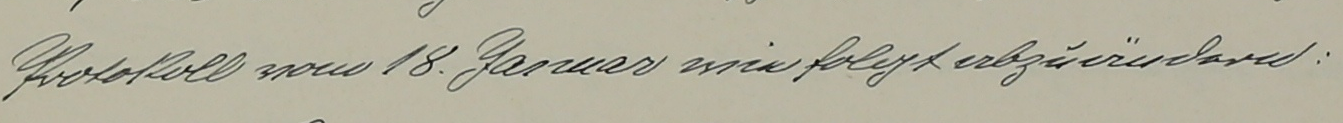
Protokoll vom 18. Januar wie folgt abzuändern:
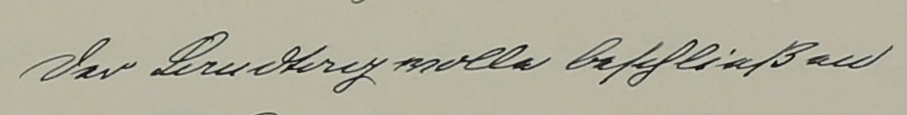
Der Landtag wolle beschließen
